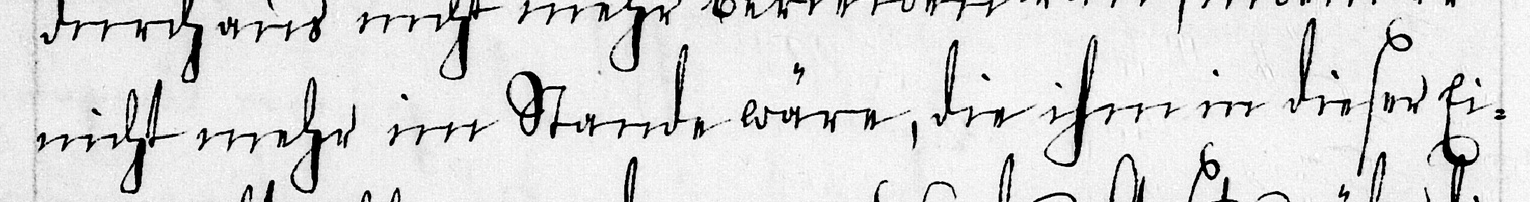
nicht mehr im Stande wäre, die ihm in dieser Ei¬
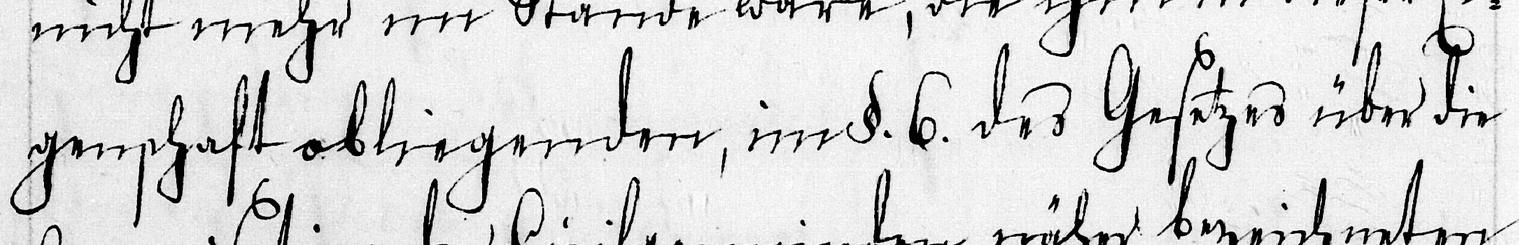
genschaft obliegenden, im §. 6. des Gesetzes über die
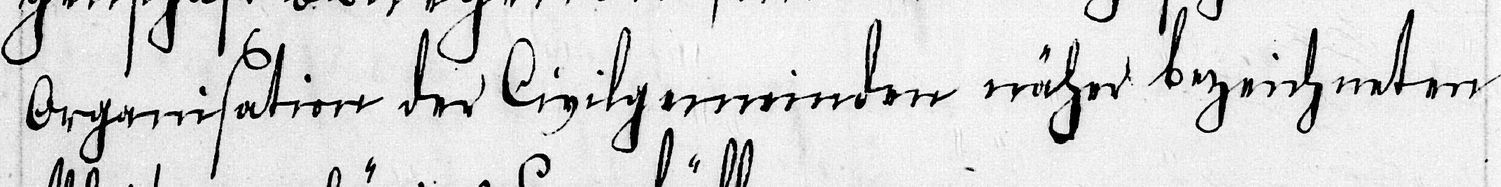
Organisation der Civilgemeinden näher bezeichneten
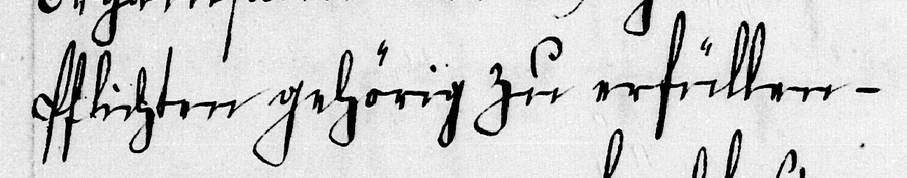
Pflichten gehörig zu erfüllen –
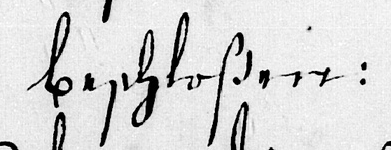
beschloßen:
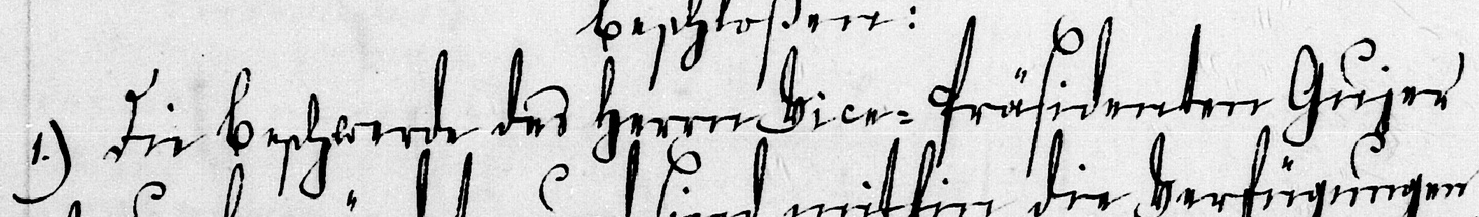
1.) Die Beschwerde des Herrn Vice-Präsidenten Gujer
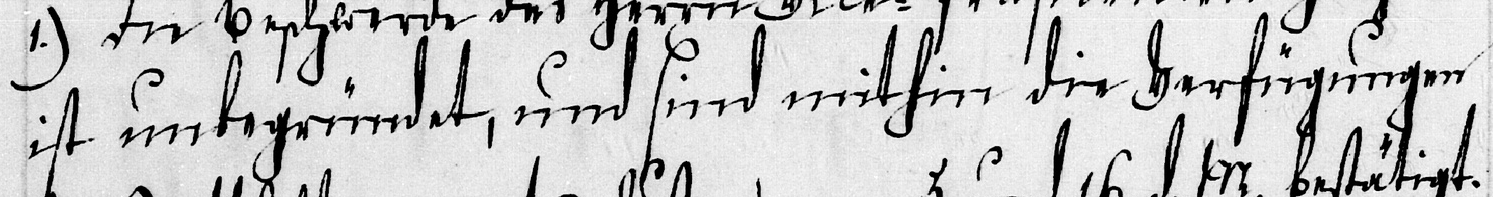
ist unbegründet, und sind mithin die Verfügungen
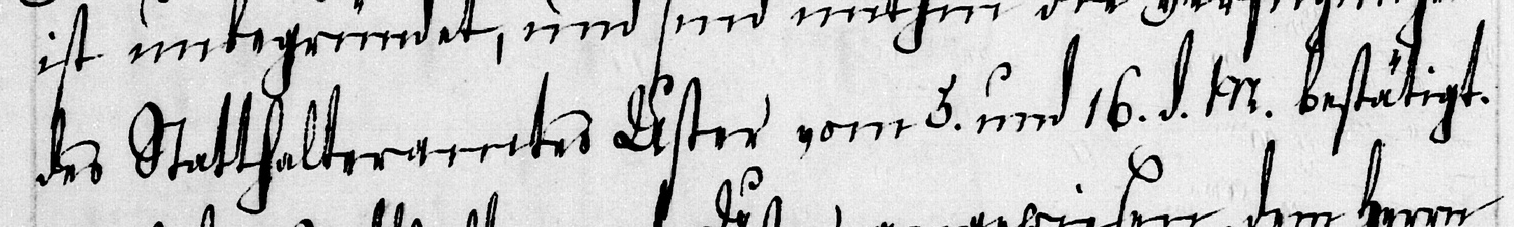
des Statthalteramtes Uster vom 5. und 16. d. M. bestätigt.
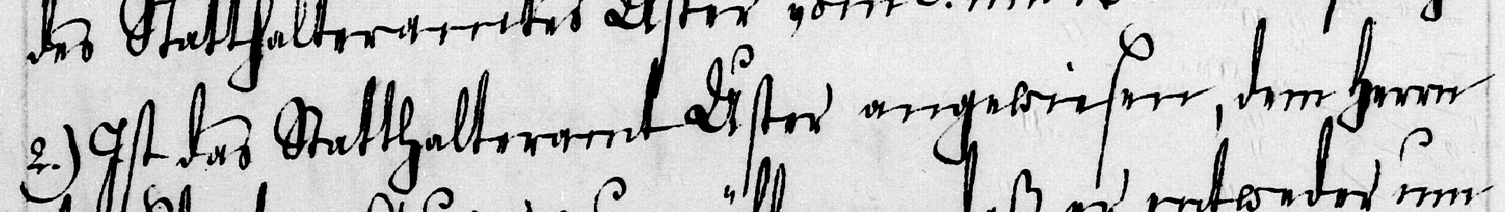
2.) Ist das Statthalteramt Uster angewiesen, dem Herrn
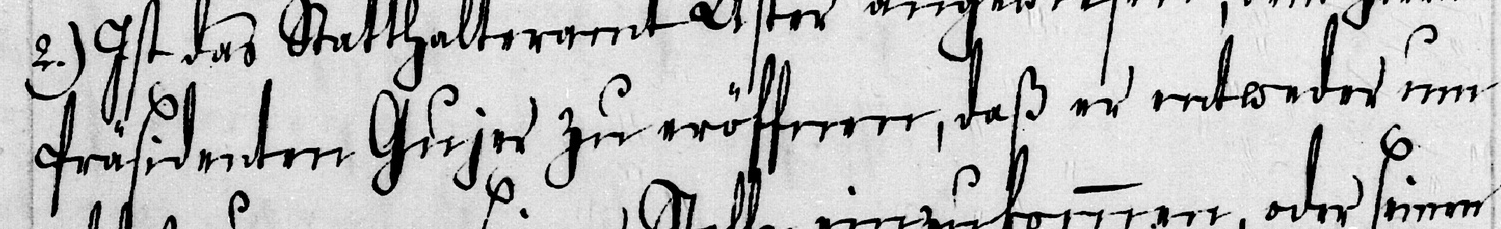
Präsidenten Gujer zu eröffnen, daß er entweder um
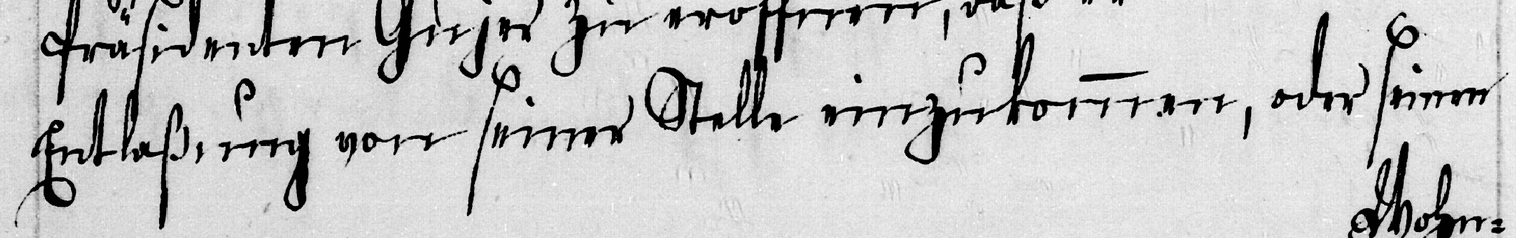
Entlaßung von seiner Stelle einzukommen, oder seinen
